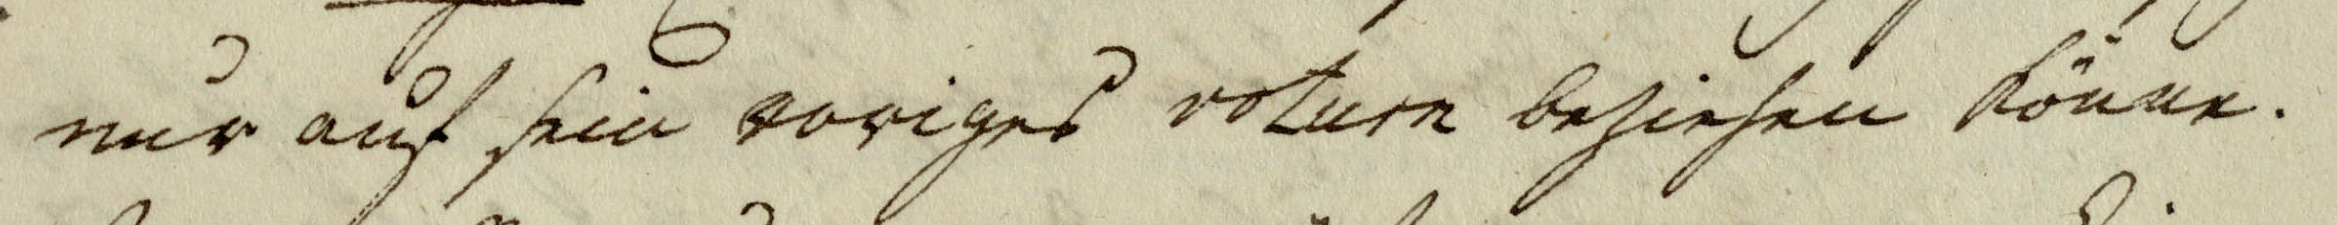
nur auf sein voriges votum beziehen könne.
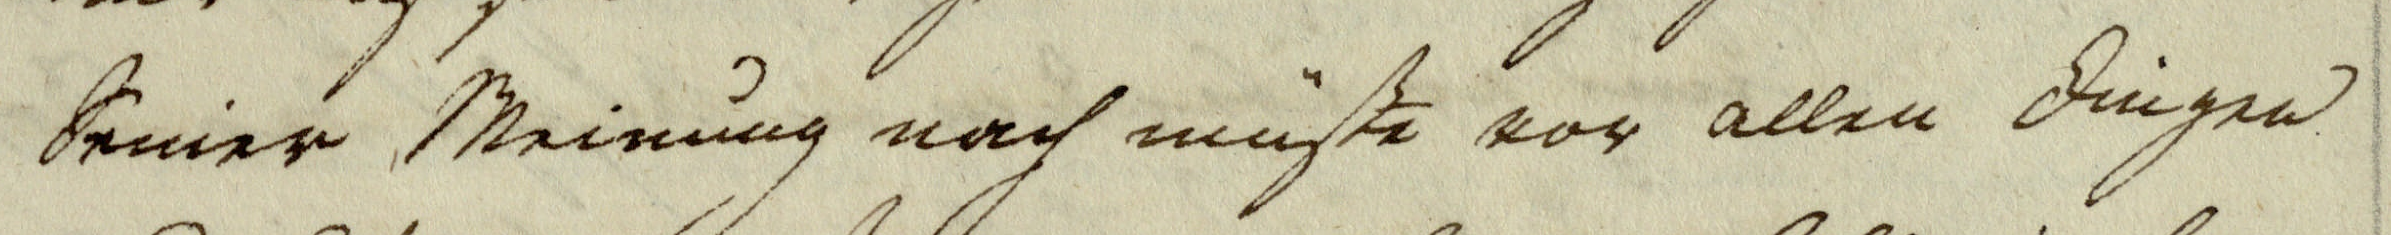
Dieser Meinung nach müßte vor allen Dingen
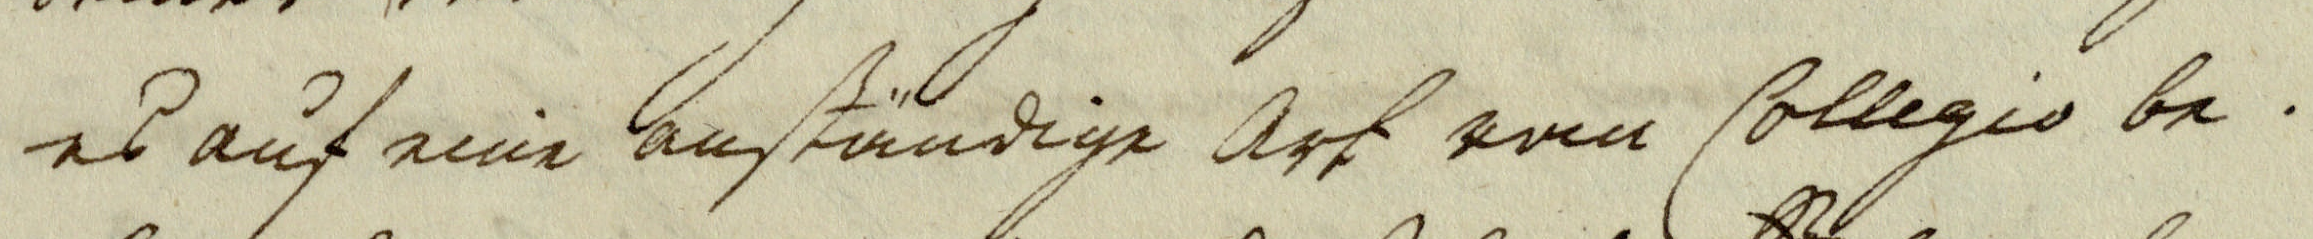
es auf eine anständige Art vom Collegio be¬
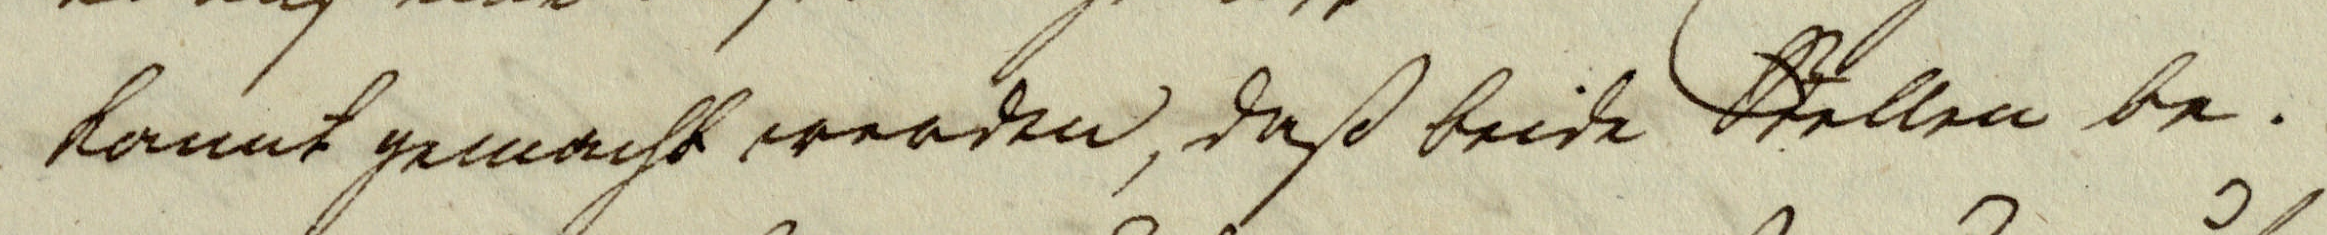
kannt gemacht werden, daß beide Stellen be¬
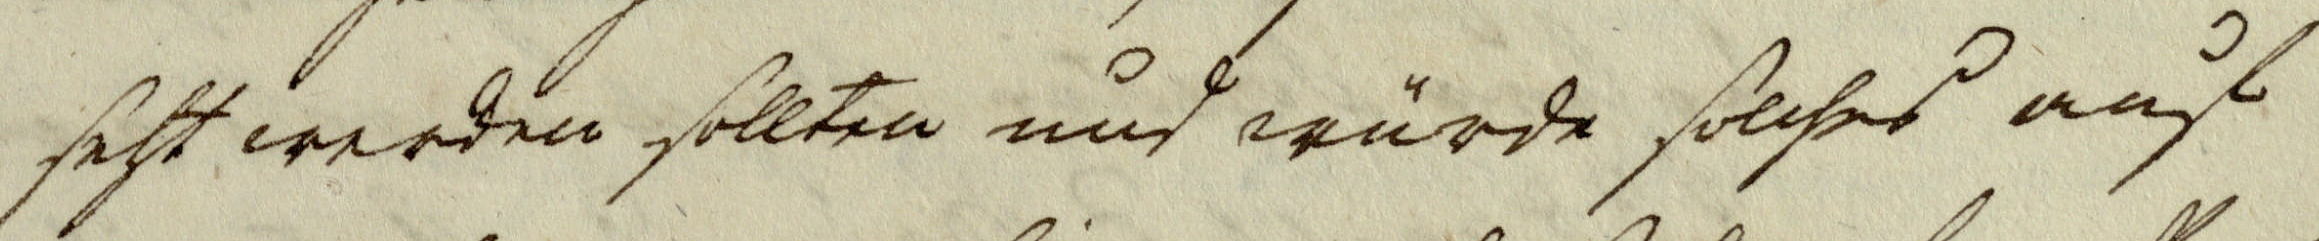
setzt werden sollten und würde solches auf
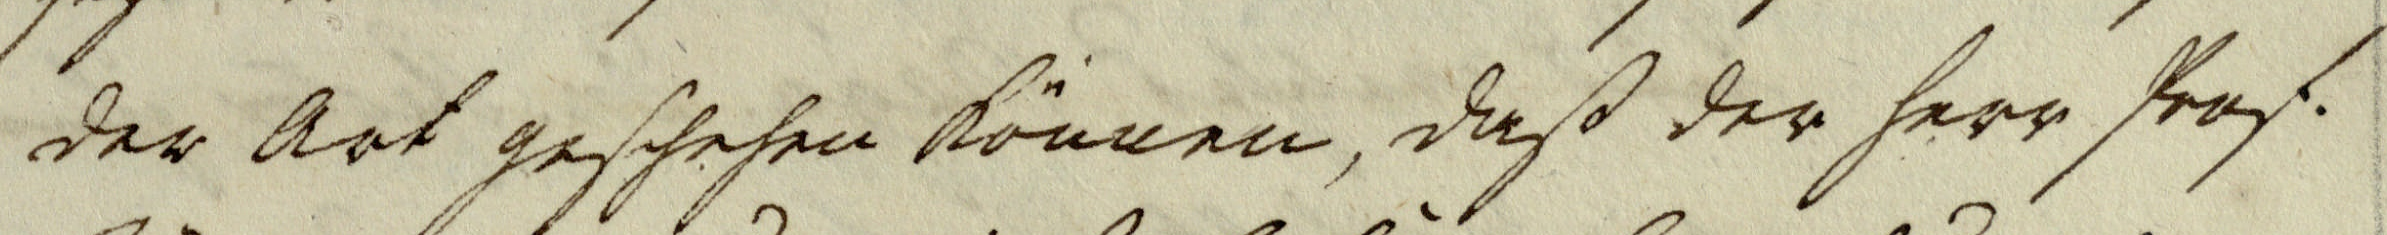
der Art geschehen können, daß der Herr Prof.
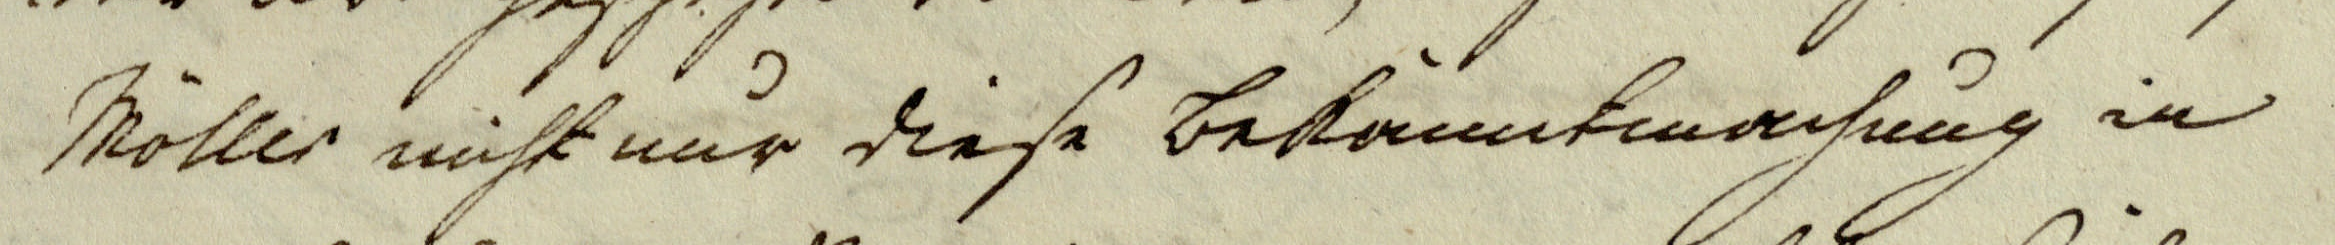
Möller nicht nur diese Bekanntmachung in
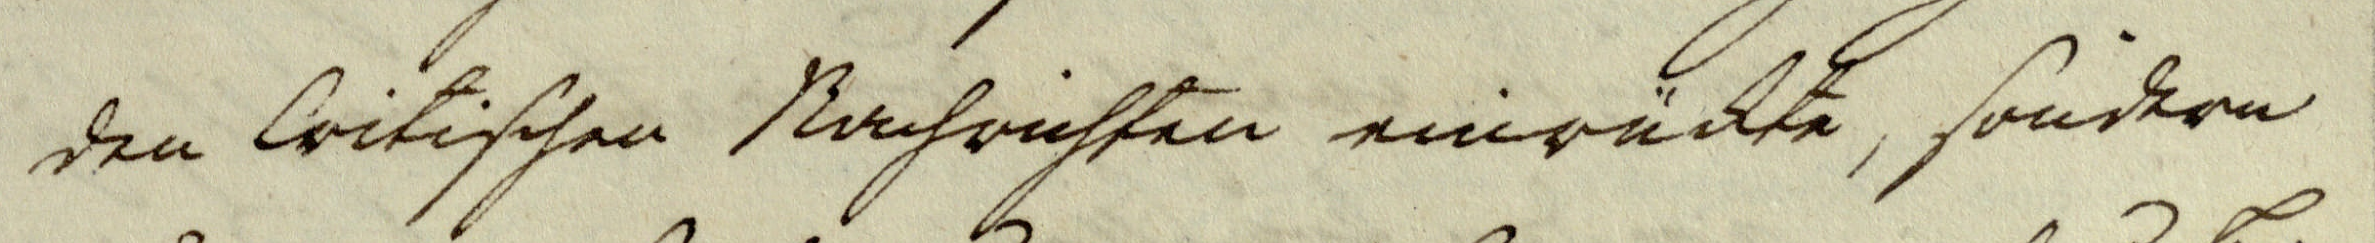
den Critischen Nachrichten einrückte, sondern
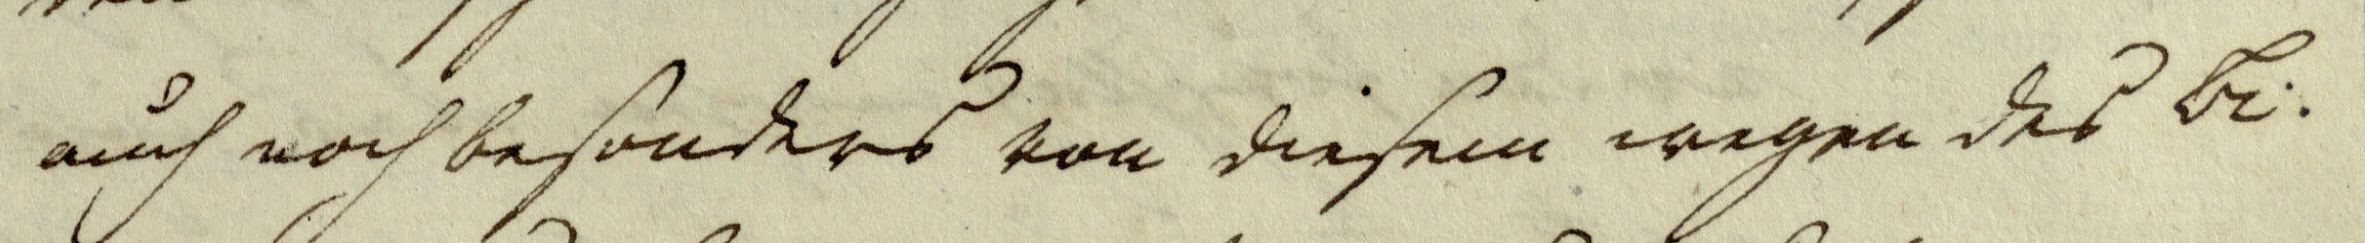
auch noch besonders von diesem wegen des Bi¬
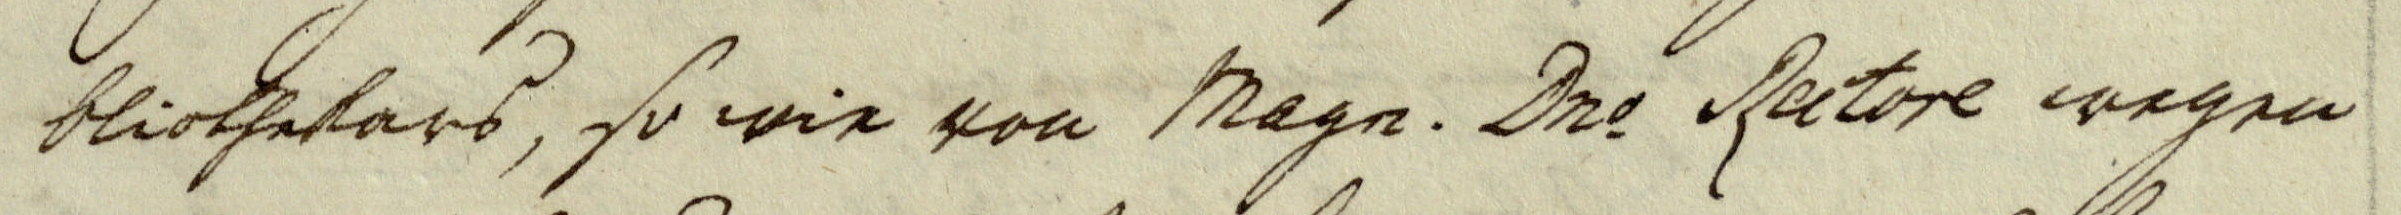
bliothekars, so wie von Magn. Dn. Rectore wegen
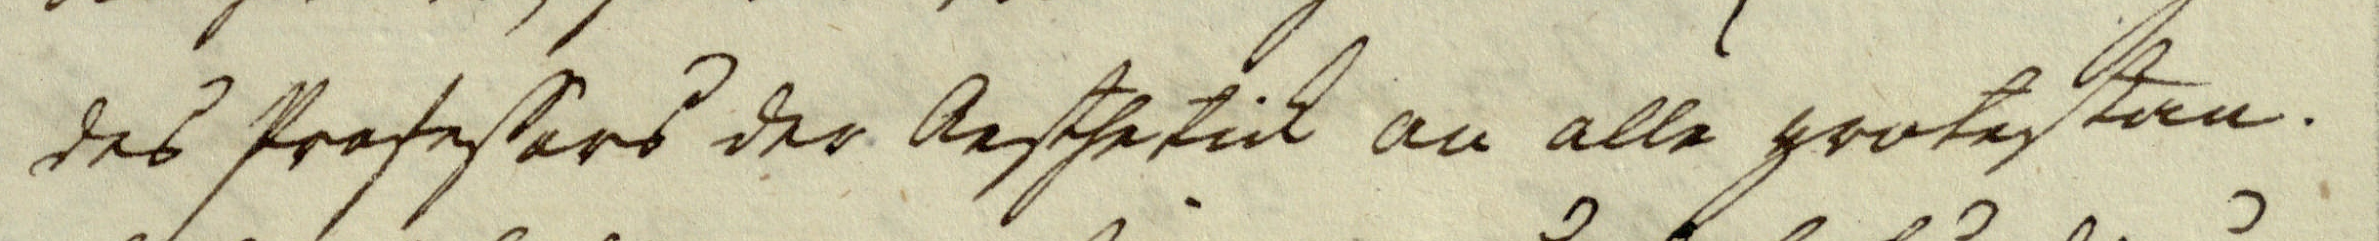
des Professors der Aesthetick an alle protestan¬
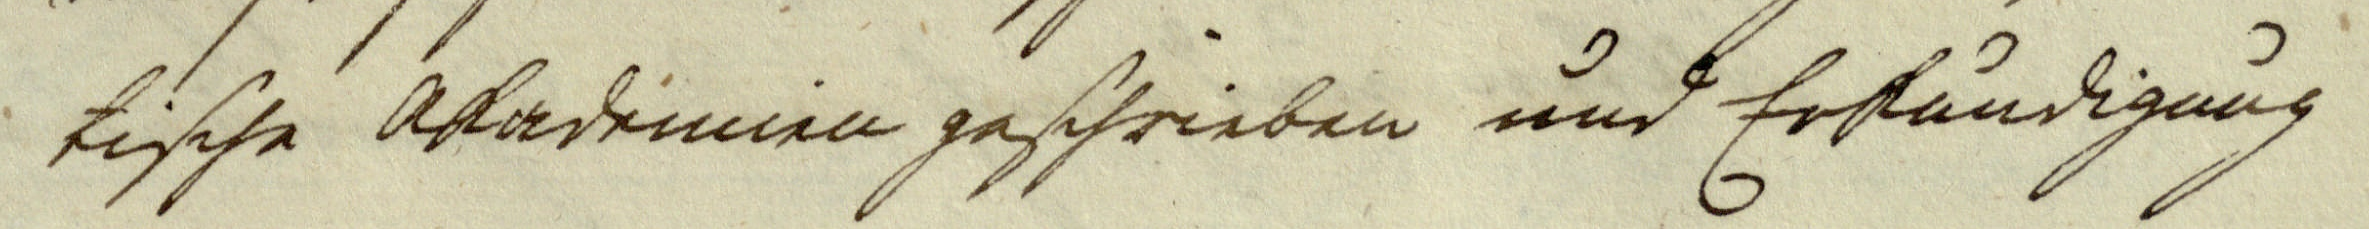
tischen Akademien geschrieben und Erkundigung
